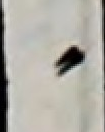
„
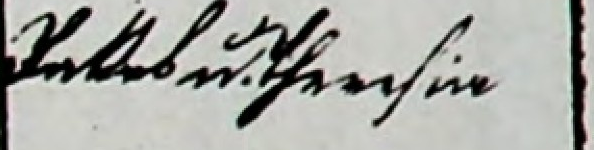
Jakob u. Theresia
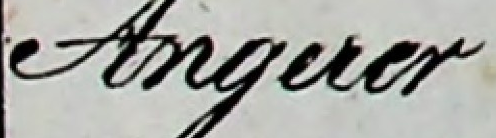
Angerer
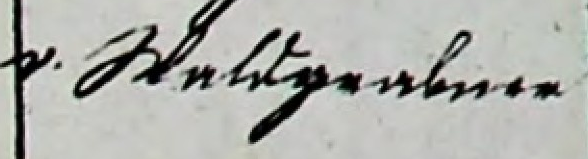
v. Waldgrabner
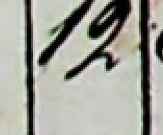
12
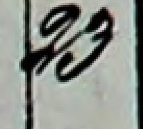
23
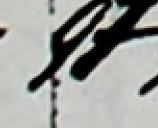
97
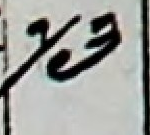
76
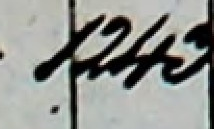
1243
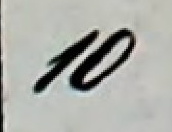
10
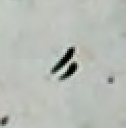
„
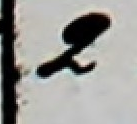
2
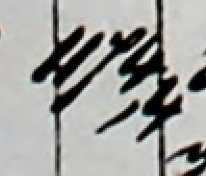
474,4
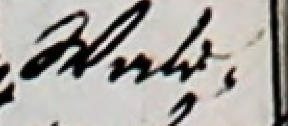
Wald„
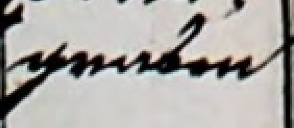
graben
